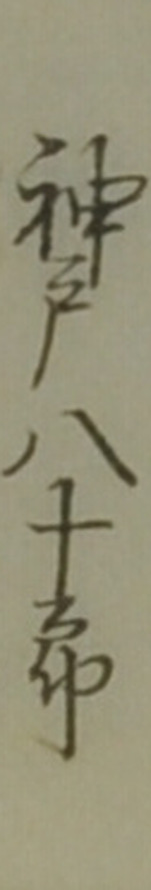神戸八十郎
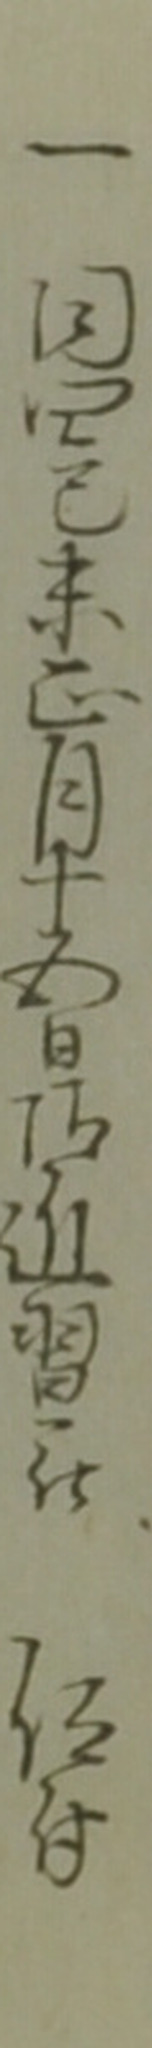一同四己未正月十五日御近習被仰付
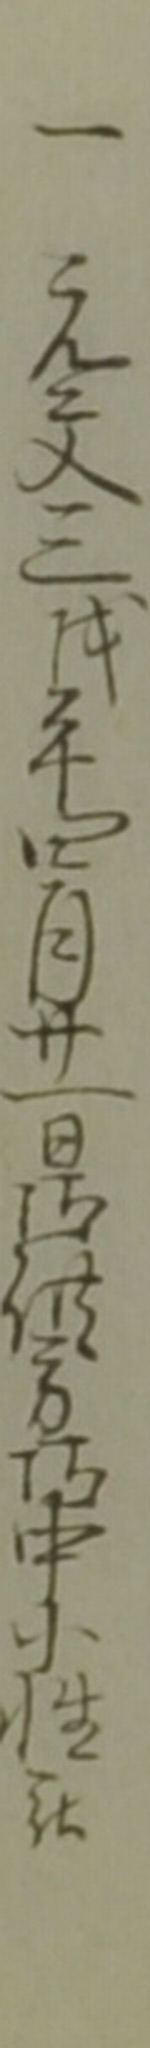一元文三戊午四月廿一日御供方中小性被
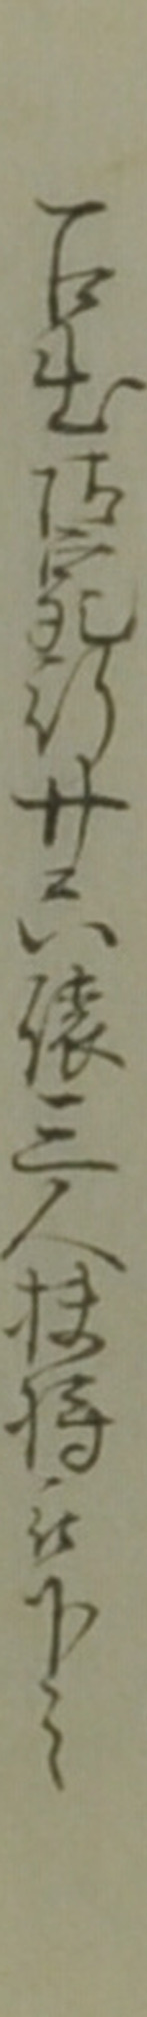召出御宛行廿六俵三人扶持被下之
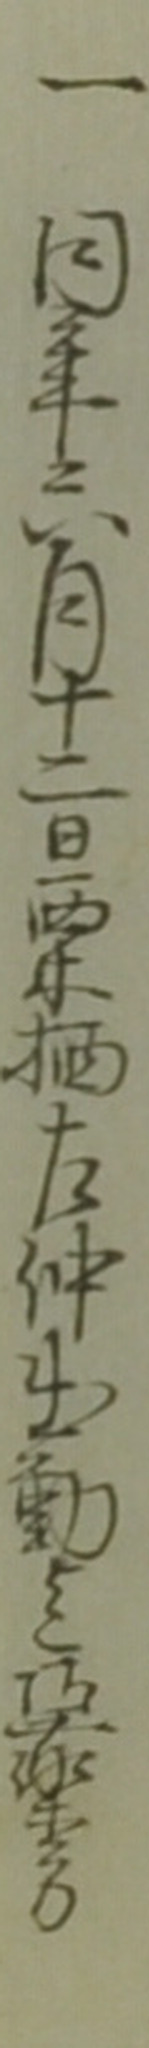一同年六月十二日栗栖左仲出勤迄御薬方
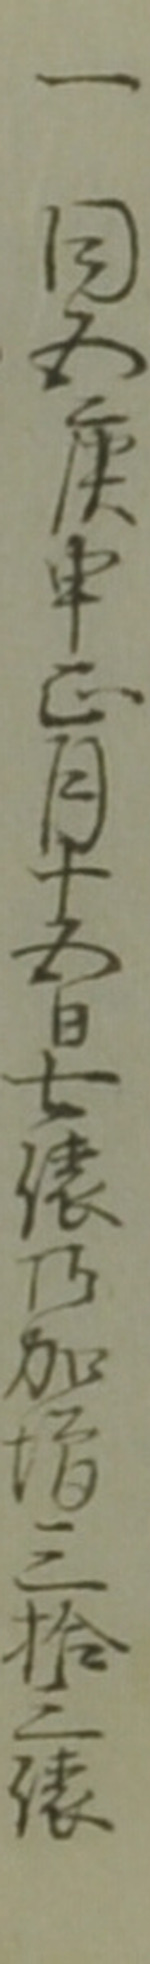一同五庚申正月十五日七俵御加増三拾三俵
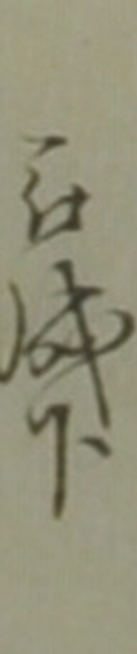被成下
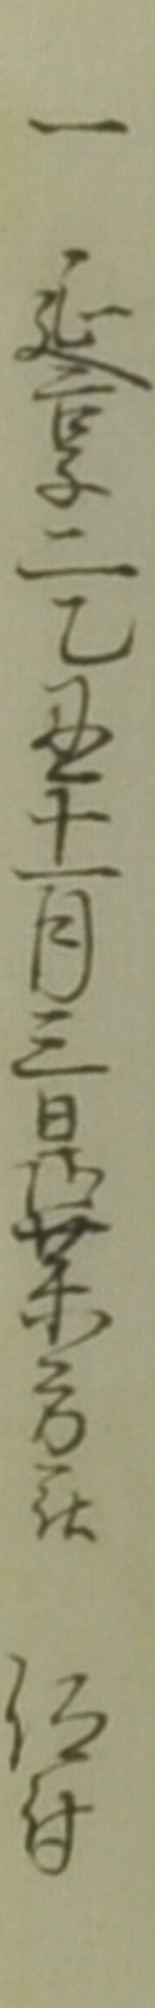一延享二乙丑十一月三日御薬方被仰付
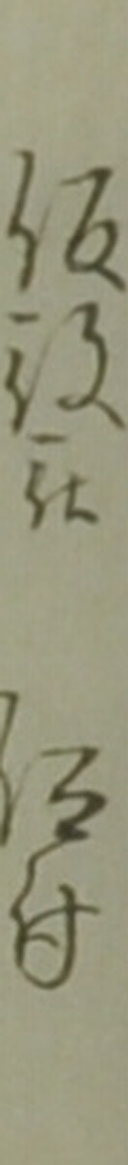仮役被仰付

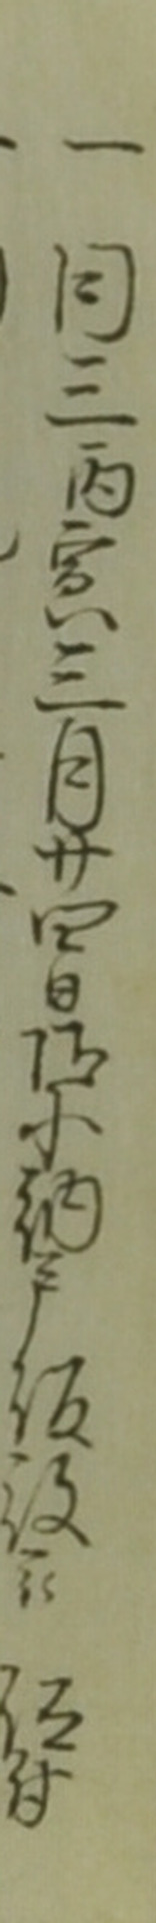一同三丙寅三月廿四日御小納戸仮役被仰付
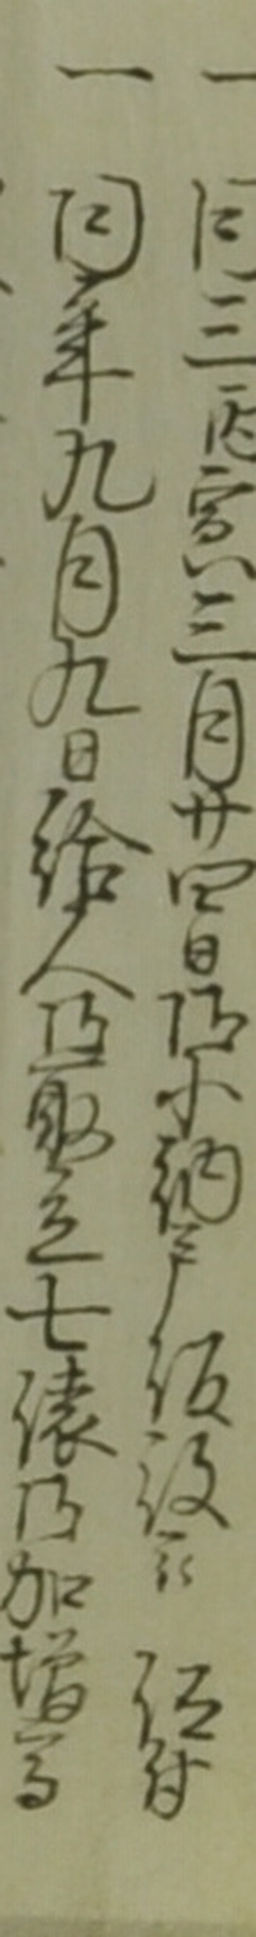一同年九月九日給人御取立七俵御加増高
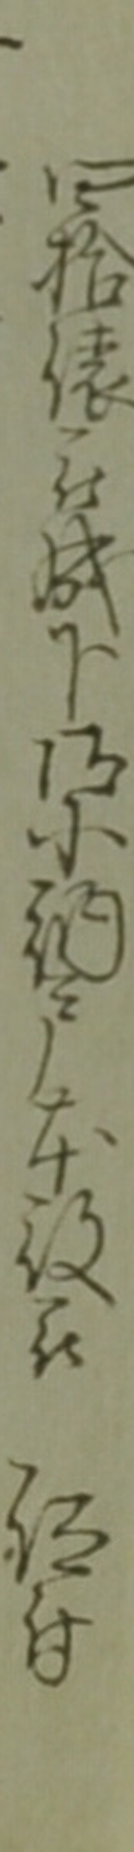四十俵被成下御小納戸本役被仰付
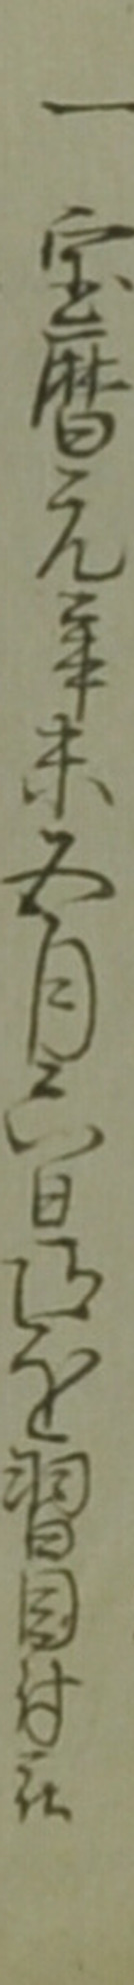一宝暦元辛未五月六日御近習目付被
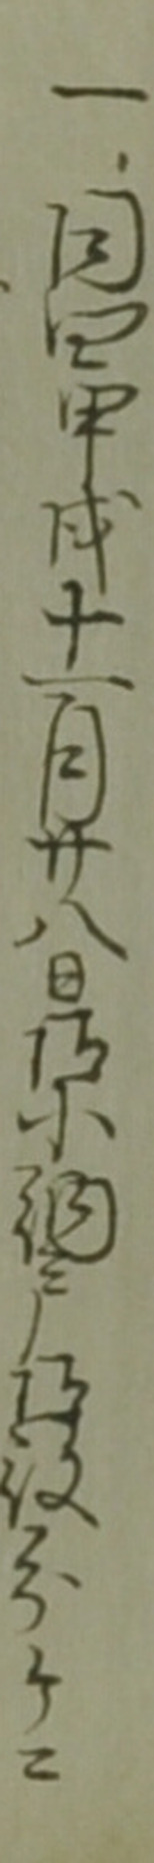一同四甲戌十一月廿八日御小納戸御役分ヶニ
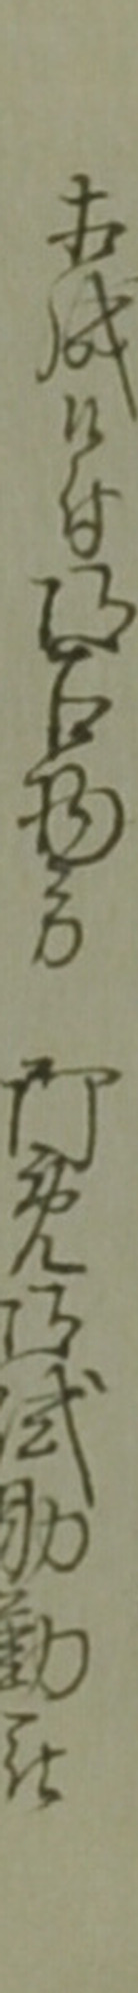相成候付御召物方御免御試助勤被
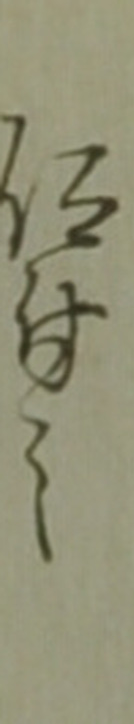仰付之
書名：給人諸士勤仕録（三）
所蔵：伊那市立高遠町図書館・合同会社AMANE
